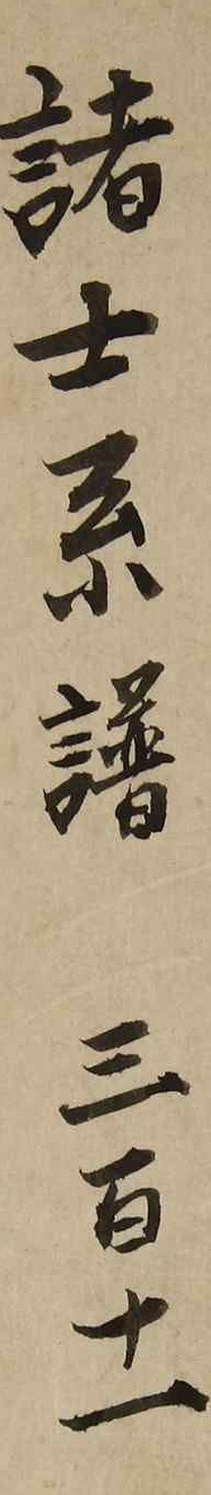諸士系譜三百十一

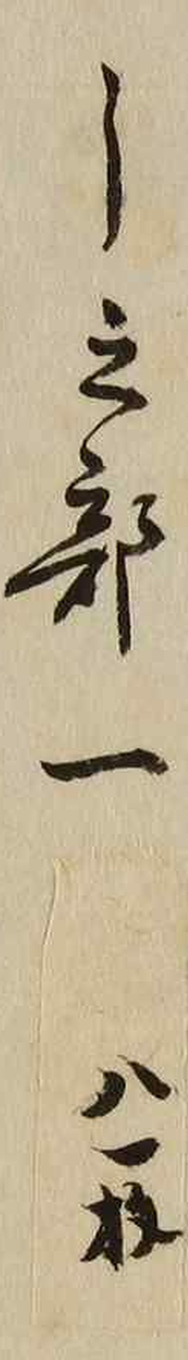し之部一八一枚
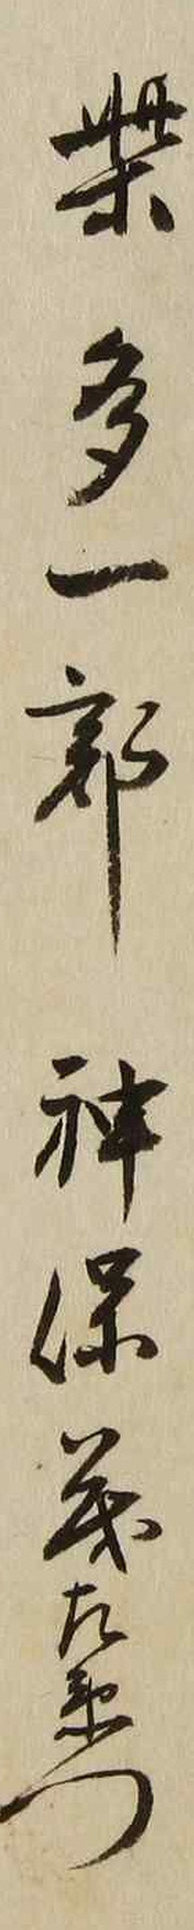柴太一郎神保茂左衛門

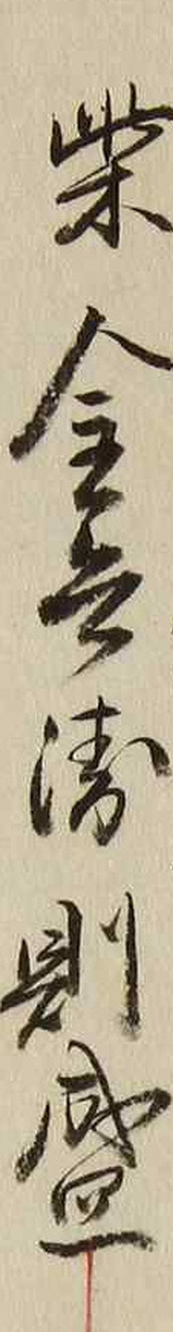柴金兵衛則盛
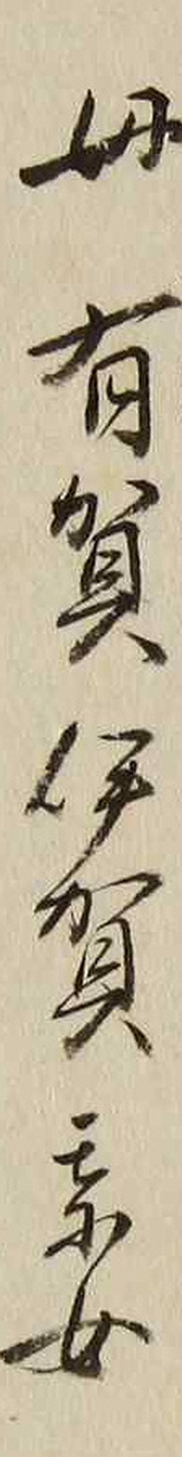母有賀伊賀某女
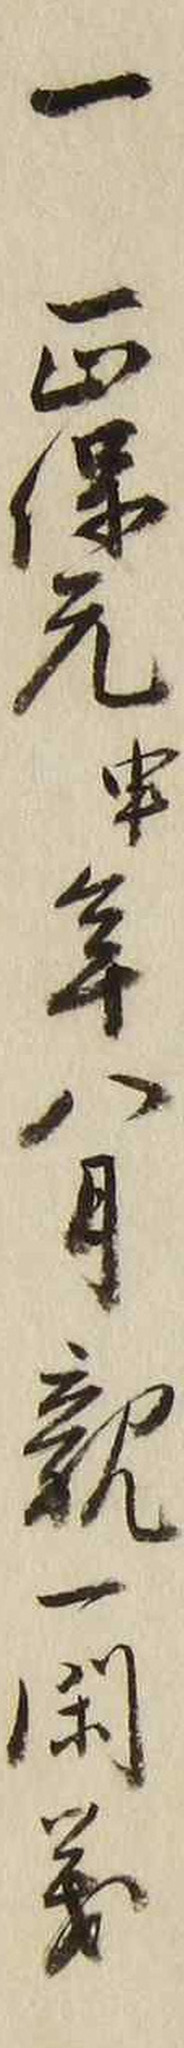一正保元申年八月親一閑義
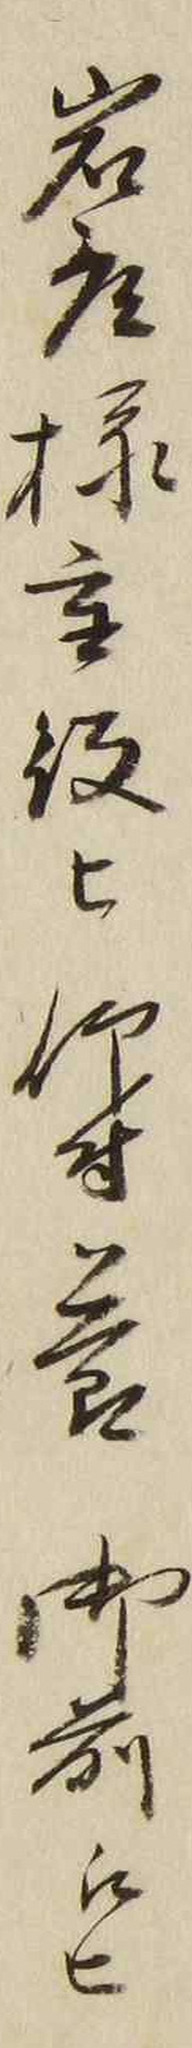岩彦様重役被仰付候節御前江被

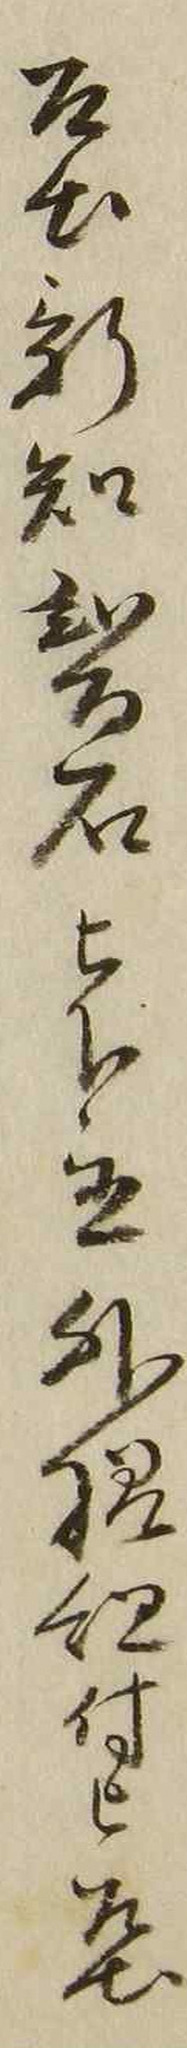召出新知弐百石被下置外様組付被召出
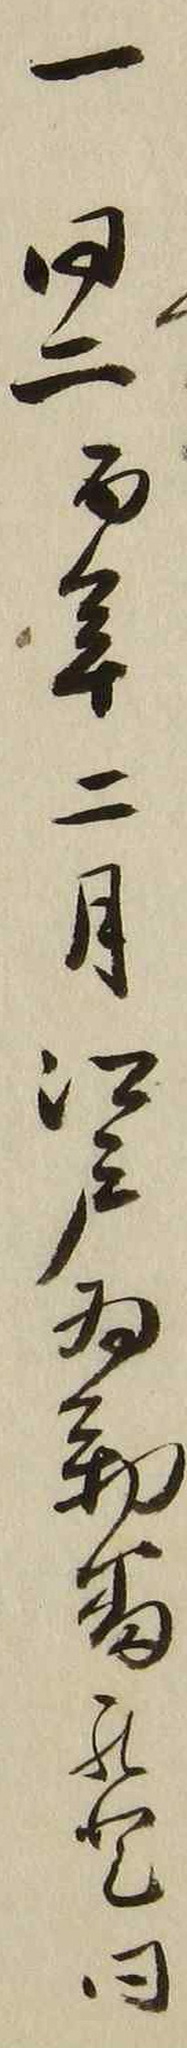一同二酉年二月江戸為勤番罷登同
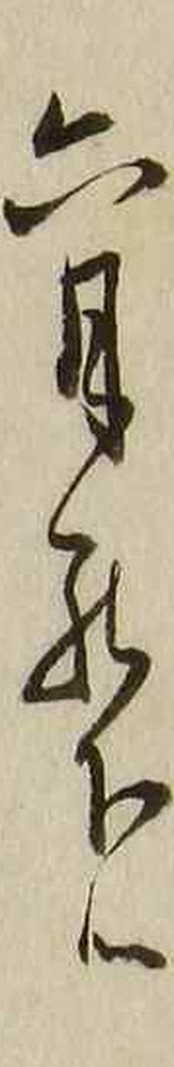六月罷下候
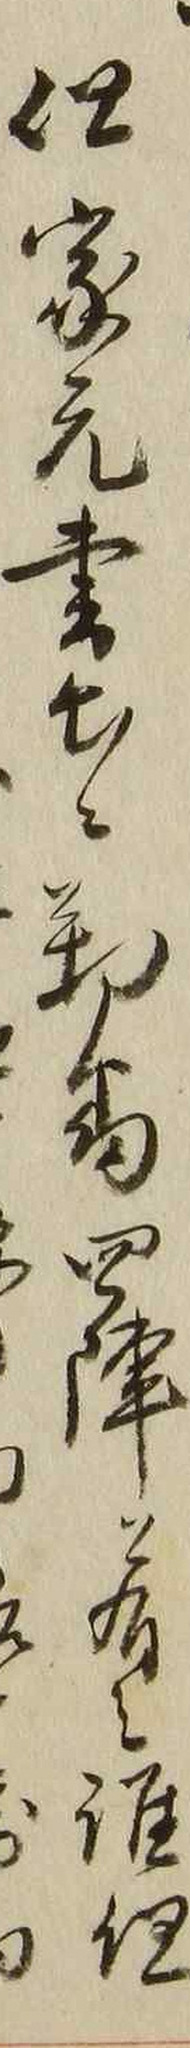但家元書出ニ勤番四陣と有之誰任
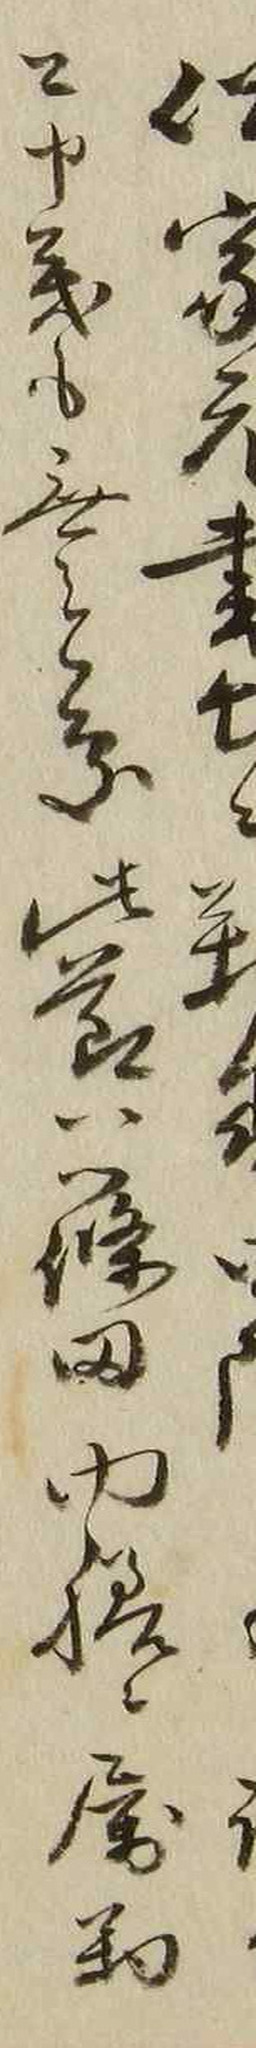と申義も無之候処此節ハ篠田内膳ニ属勤
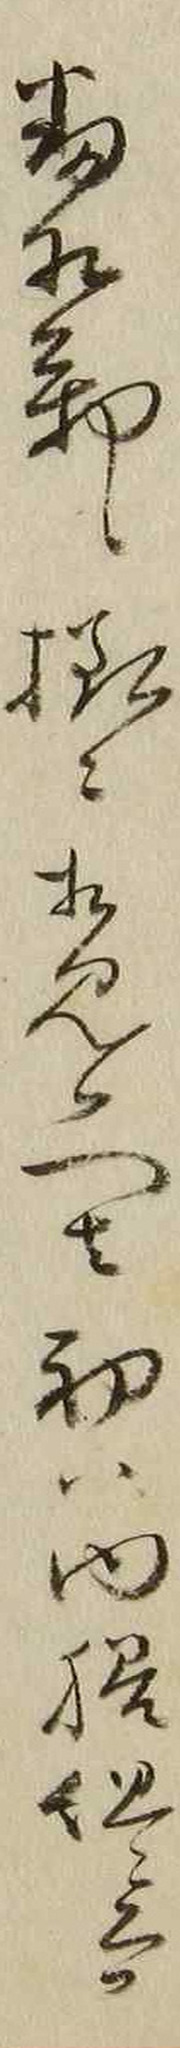番相勤候様ニ相見候へ者初ハ内膳組ニ而
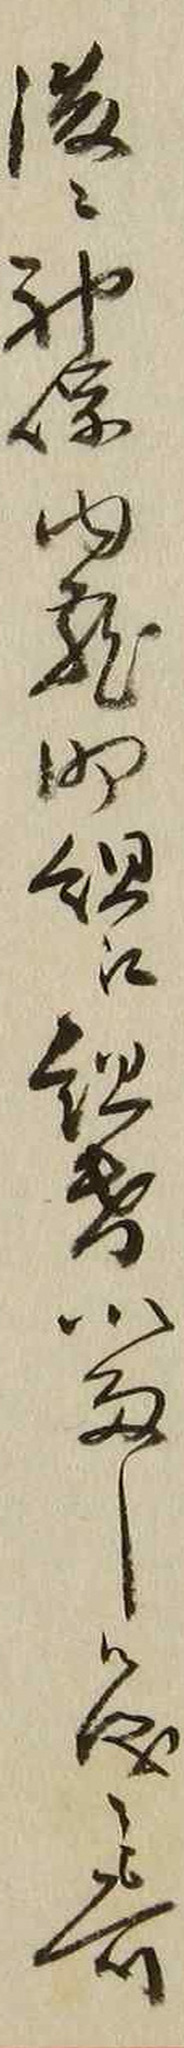後々神保内蔵助組江組替いたし候儀も可
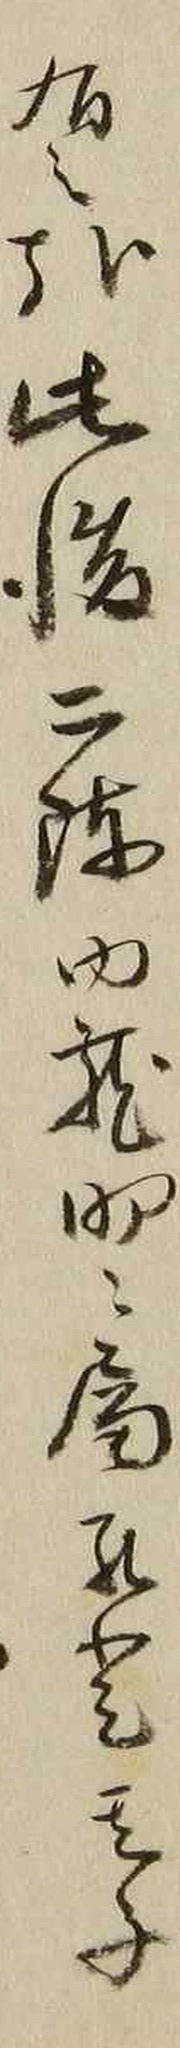有之哉比後ニ陣内蔵助ニ属罷登其子
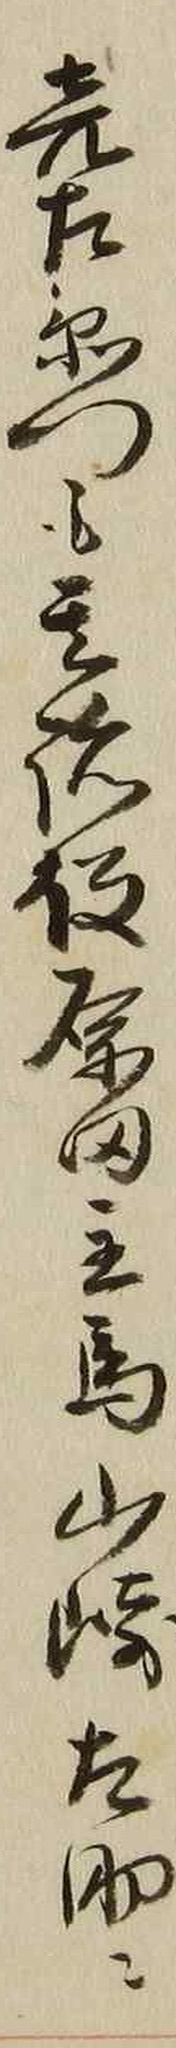喜左衛門も其跡役原田主馬山崎左助ニ
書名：諸士系譜　巻之311　し之部1
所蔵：会津若松市立会津図書館
